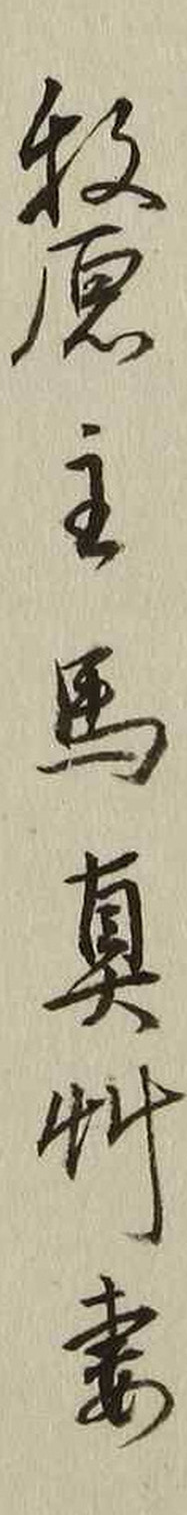女牧原主馬真艸妻
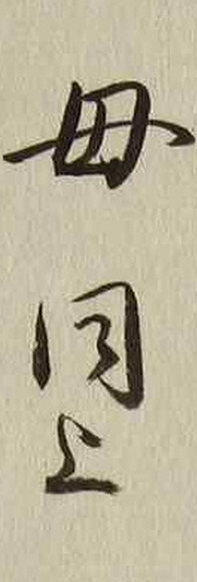母同上
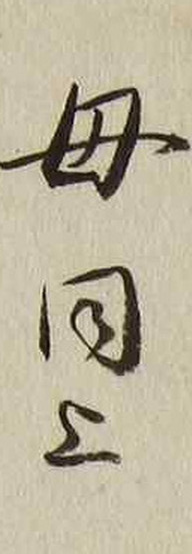母同上
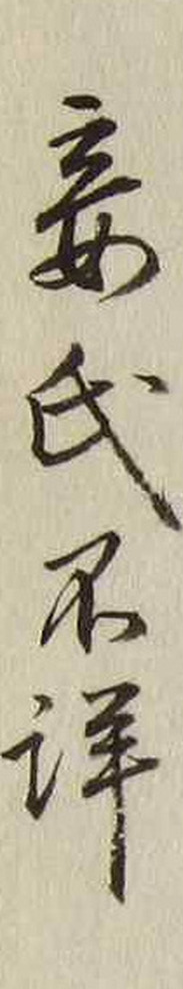妾氏不詳
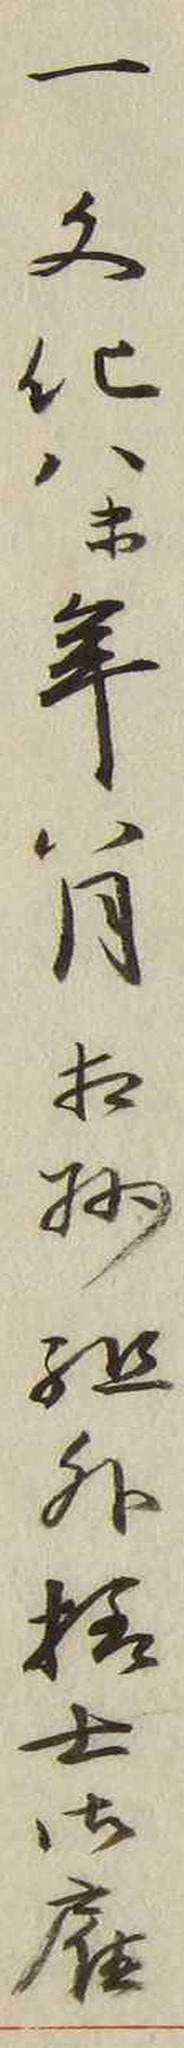一文化八未年八月相州組外様士御雇

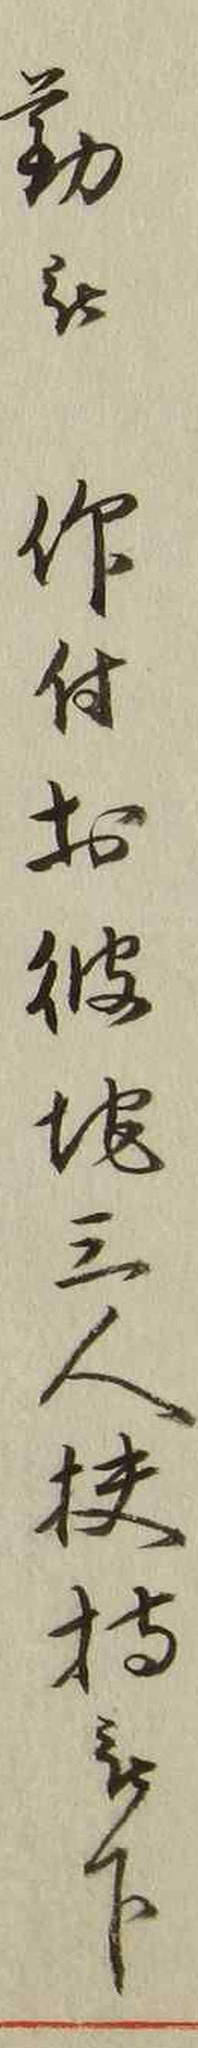勤被仰付於彼地三人扶持被下
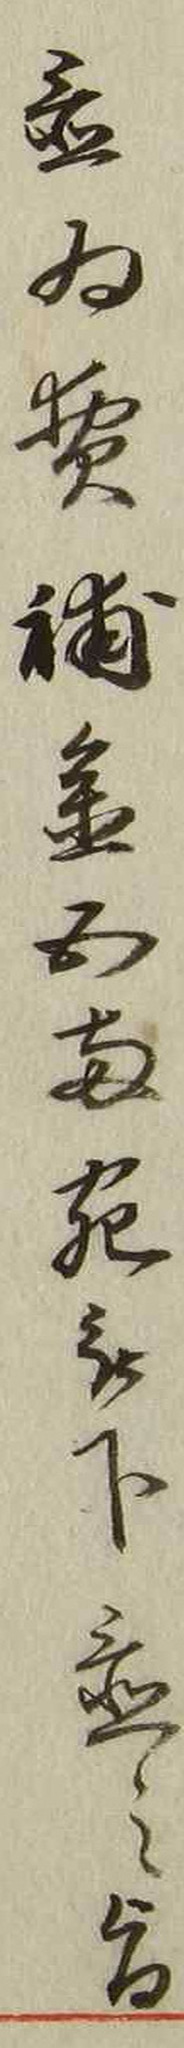置為費補金五両宛被下置之旨
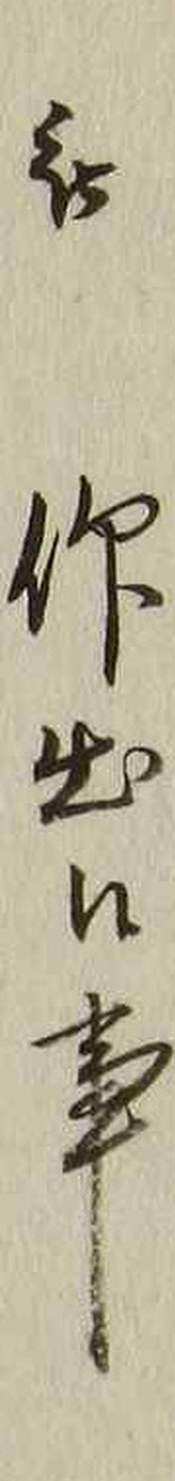被仰出候事
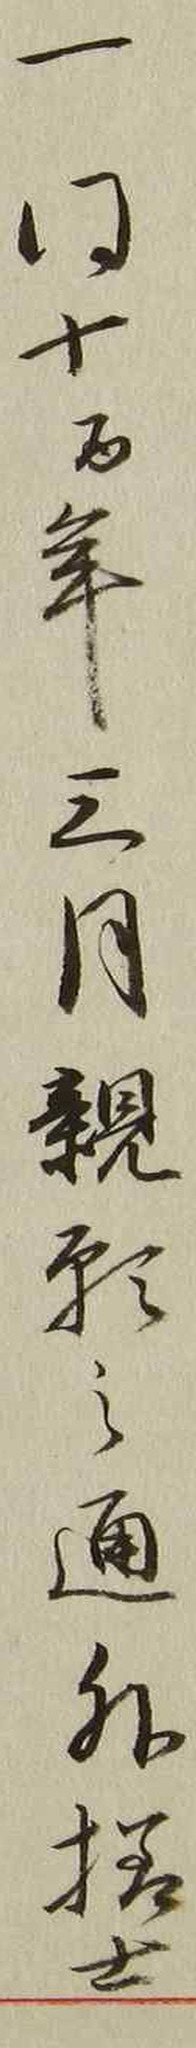一同十酉年三月親願之通外様士
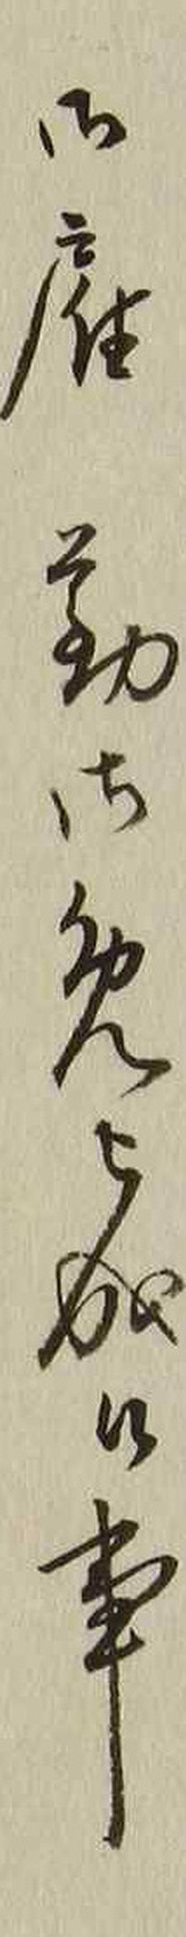御雇勤御免被成候事
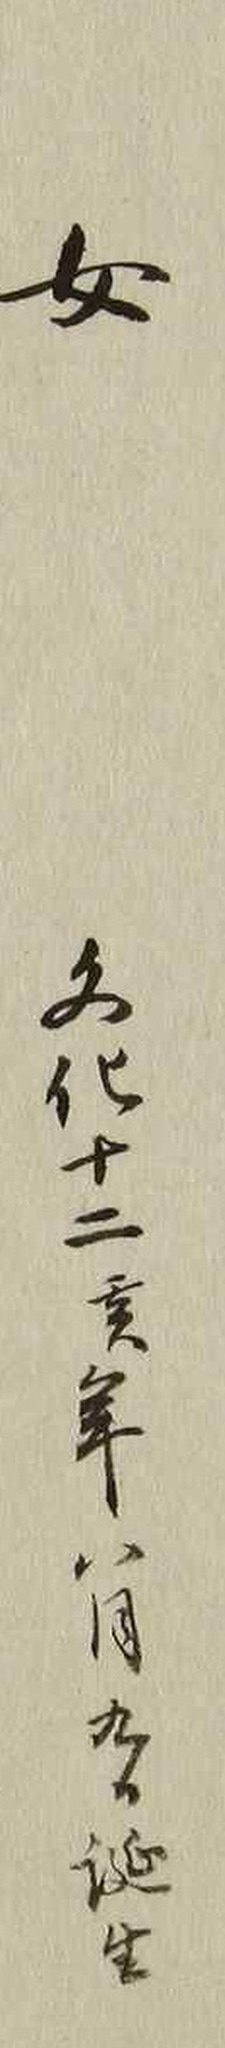女文化十二亥年八月九日誕生
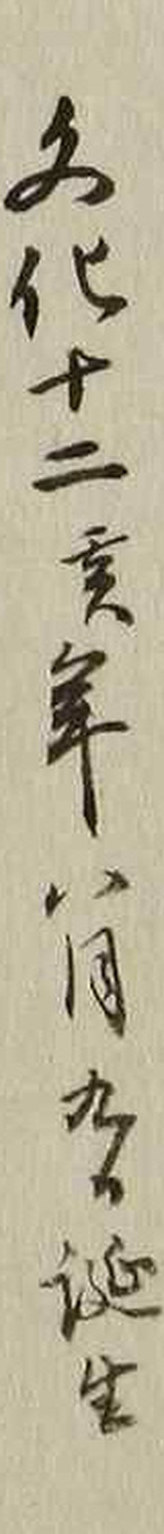女文化十二亥年八月九日誕生
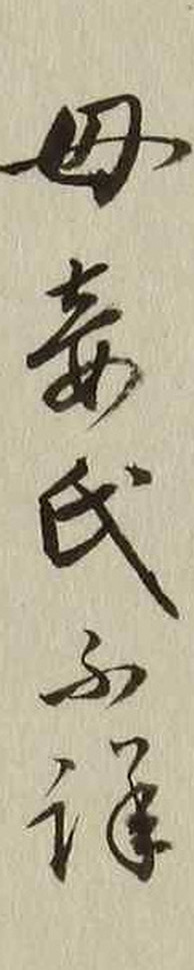母妾氏不詳
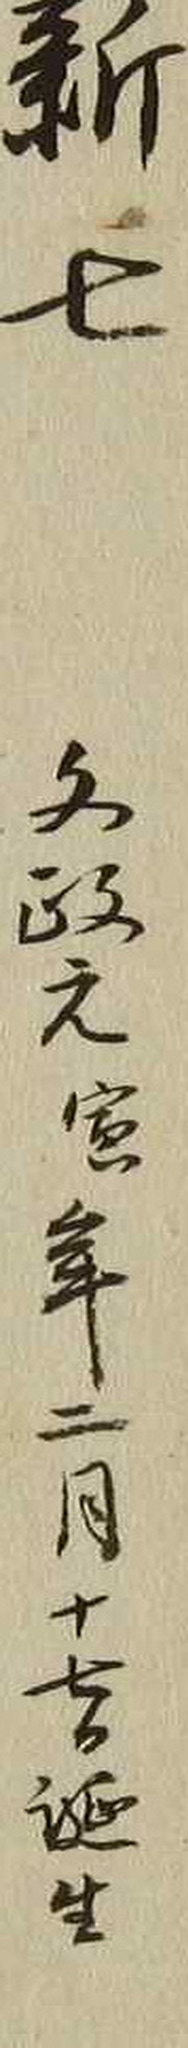新七文政元寅年二月十七日誕生
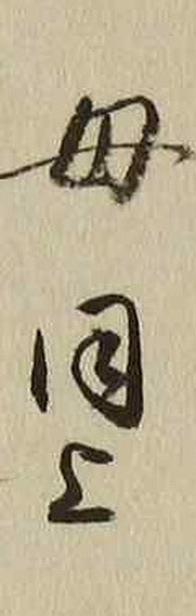母同上
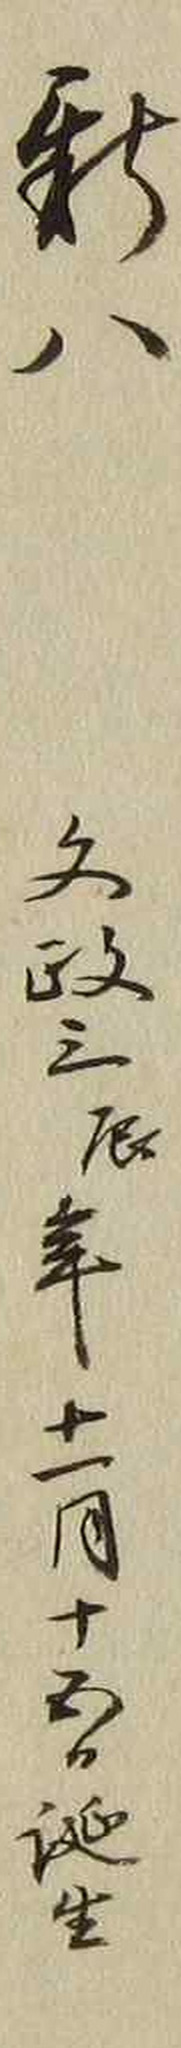新八文政三辰年十一月十五日誕生
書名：諸士系譜　巻之128　た之部4
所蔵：会津若松市立会津図書館
